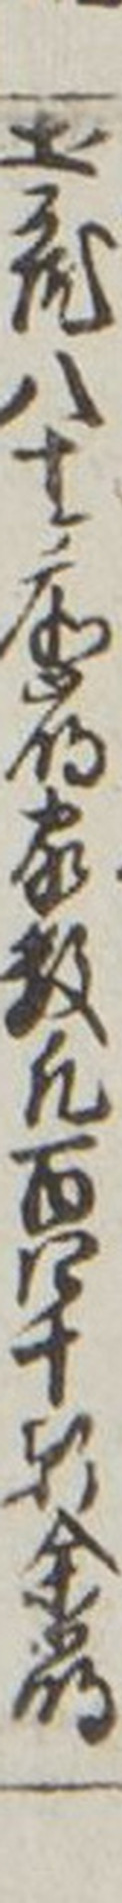土蔵八十ヶ所崩家数凡百四十軒余崩
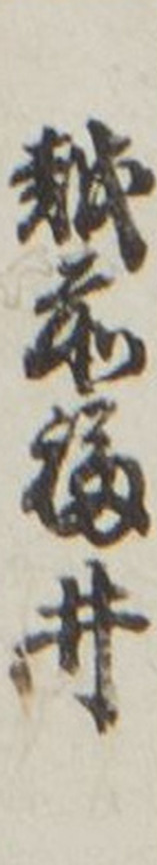越前福井
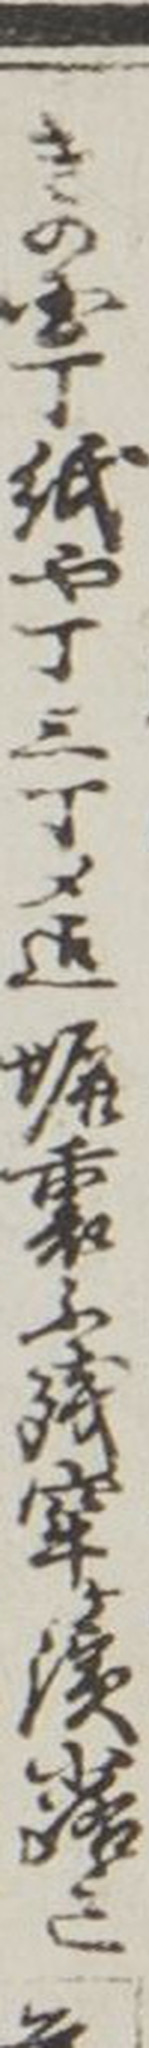きの国町紙や町三丁メ迄塀裏不残牢ヶ浜小路迄
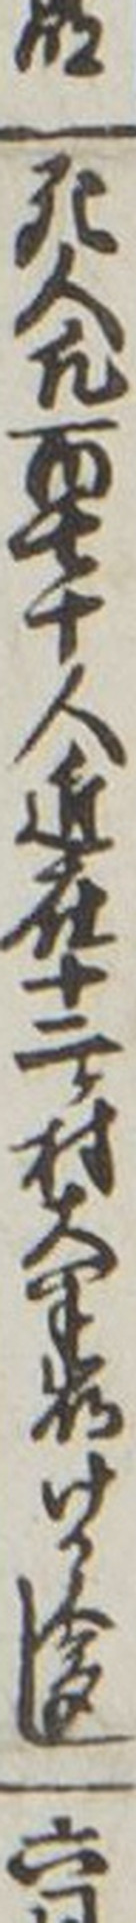死人凡百七十人近在十二ヶ村大半崩れけが人多し
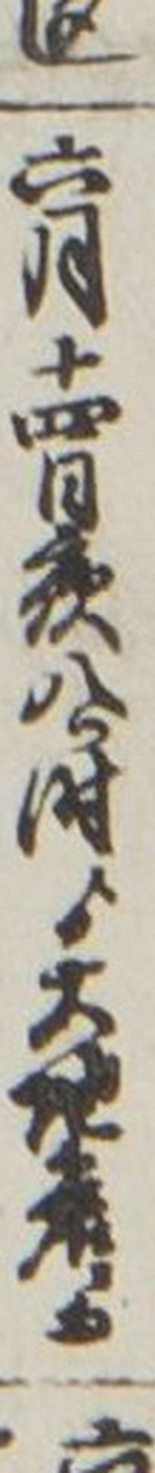六月十四日夜八つ時より大地震にて
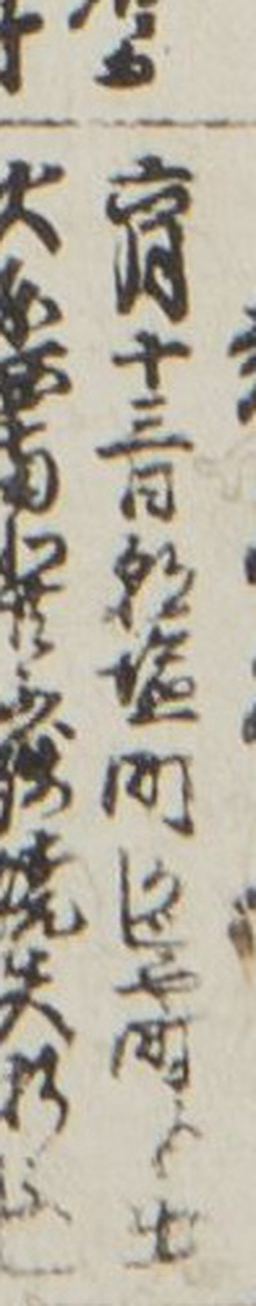火東西南北共不残焼失折ふし
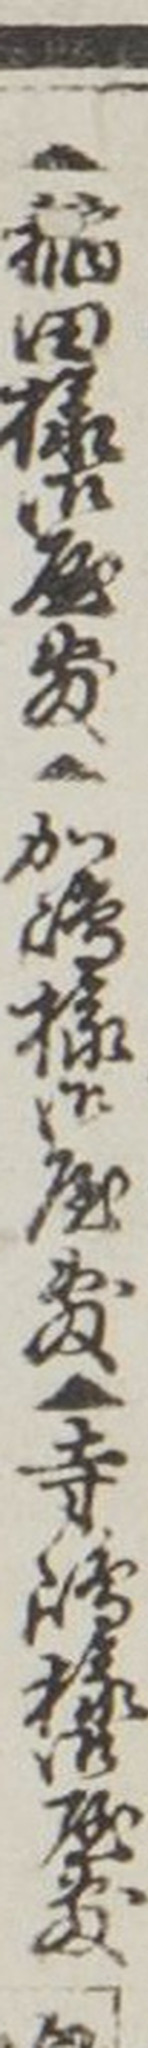▲稲田様御屋敷▲加島様御屋敷▲寺島様御屋敷
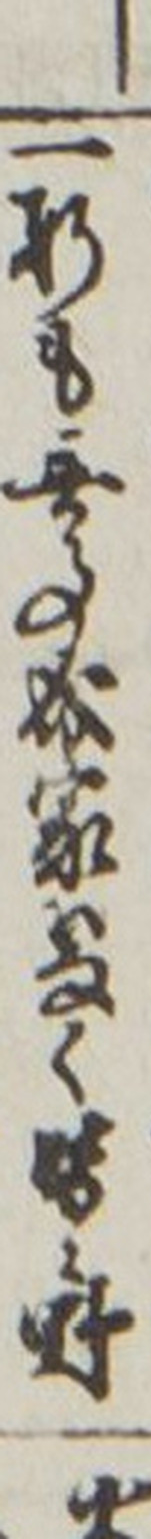一軒も無事成家はなく皆々野
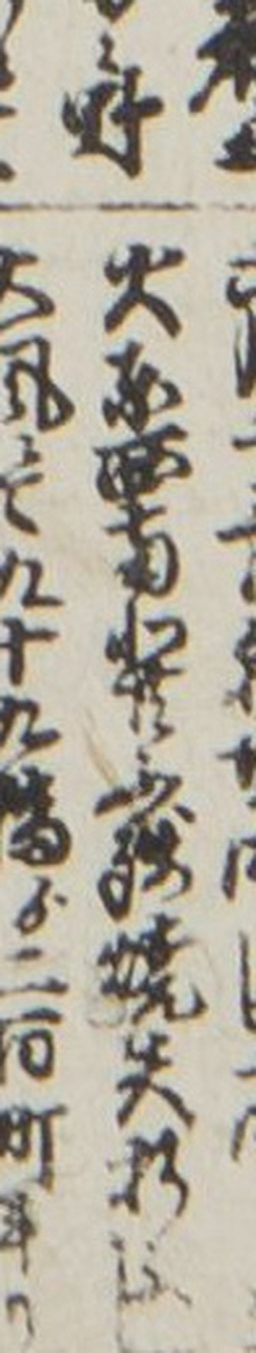大風にて九十九橋より二百町計り
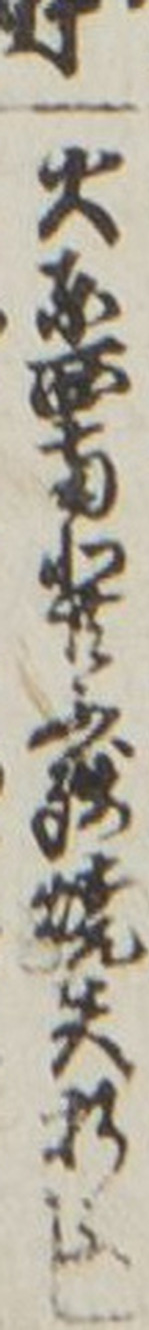火東西南北共不残焼失折ふし
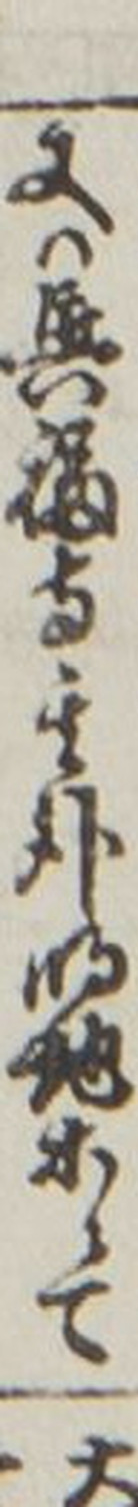又は興福寺其外明地等にて
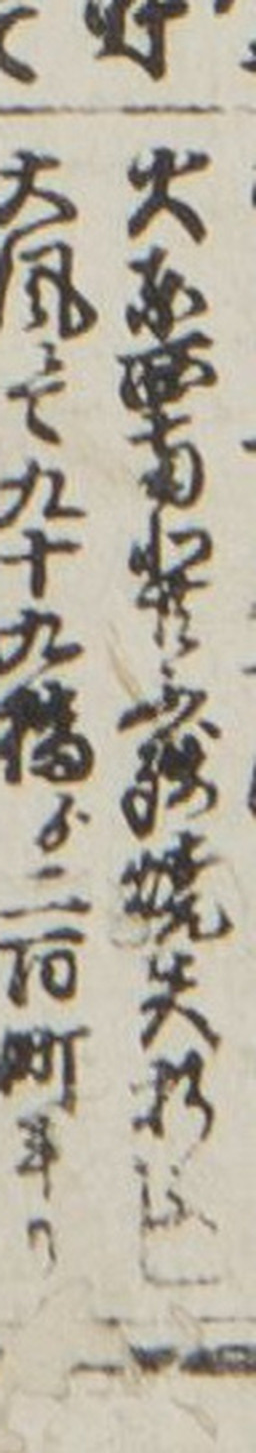大風にて九十九橋より二百町計り
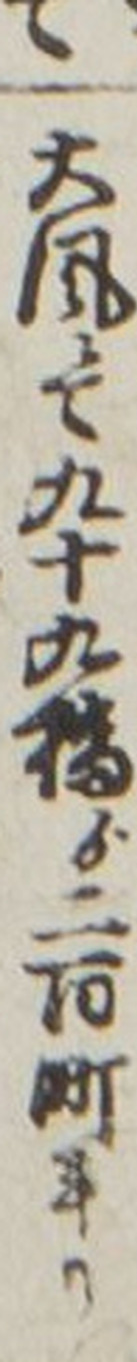大風にて九十九橋より二百町計り
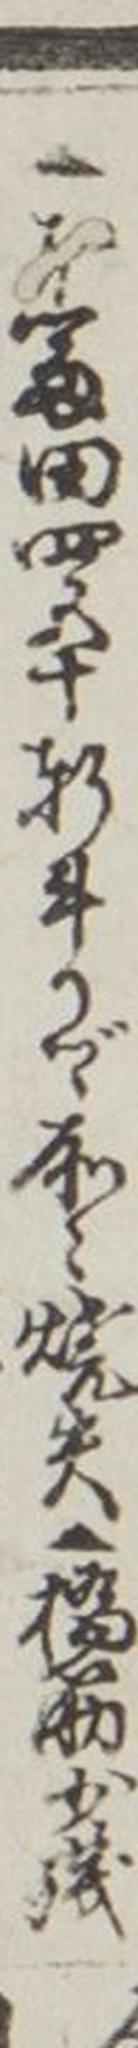▲富田四五十軒計りづゝ所々焼失▲橋筋少残
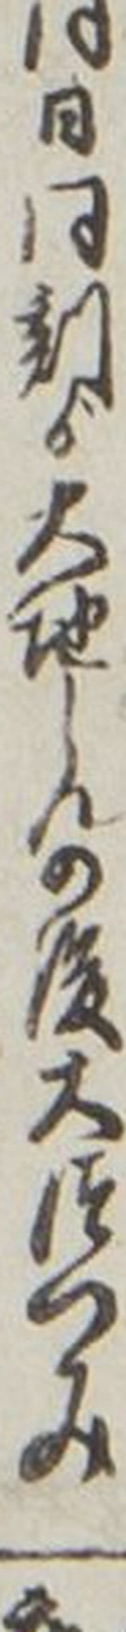同日同刻より大地しんの後大つつみ
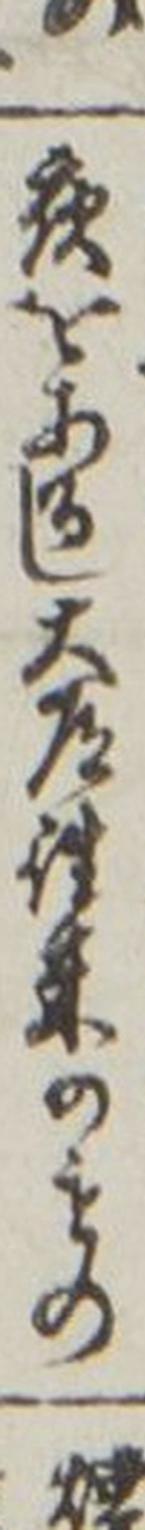夜をあかし大道往来のもの
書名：嘉永七年寅十一月諸国大地震大津波并出火
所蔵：あいおいニッセイ同和損保株式会社
